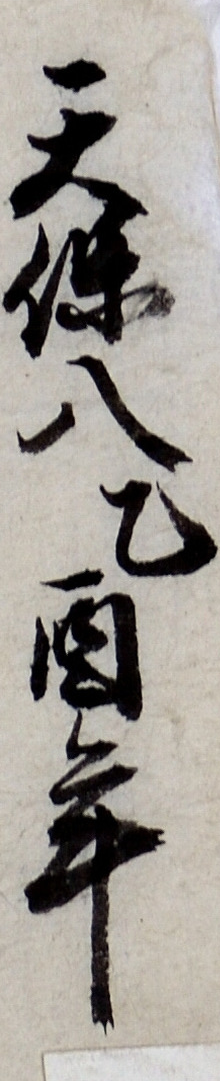天保八乙酉年
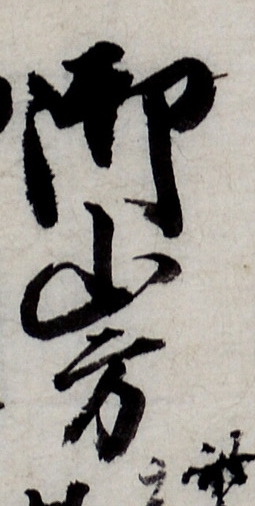御山方
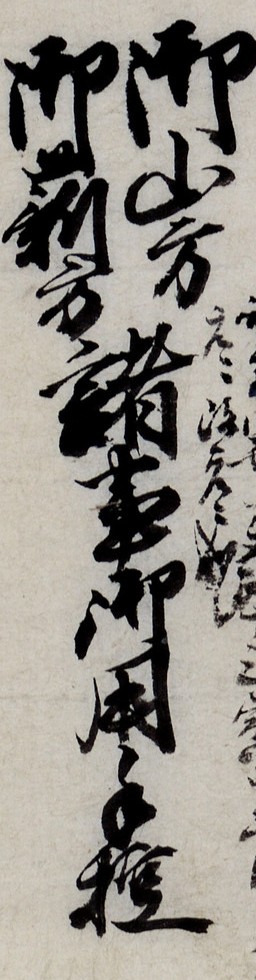御薪方諸事御用手控
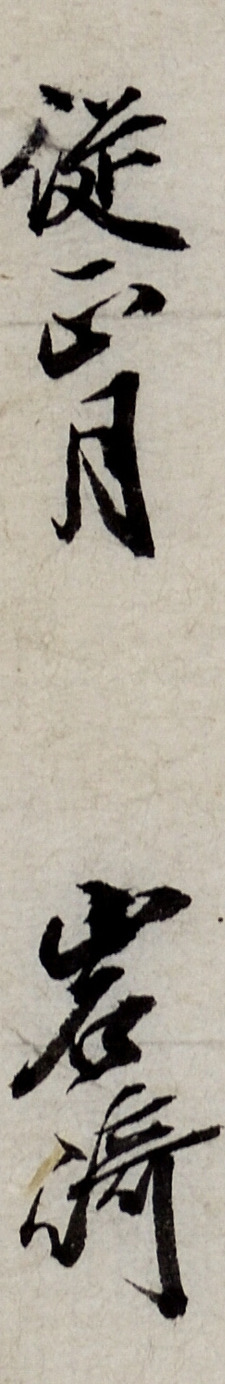従正月岩崎
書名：御山方御薪方諸事御用手控
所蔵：伊那市立高遠町図書館・合同会社AMANE
